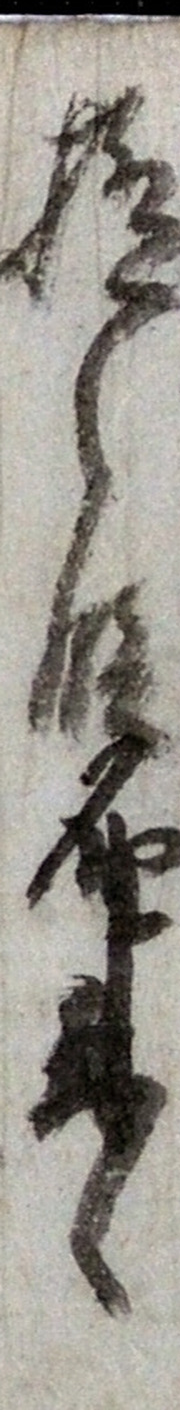極之段申来候
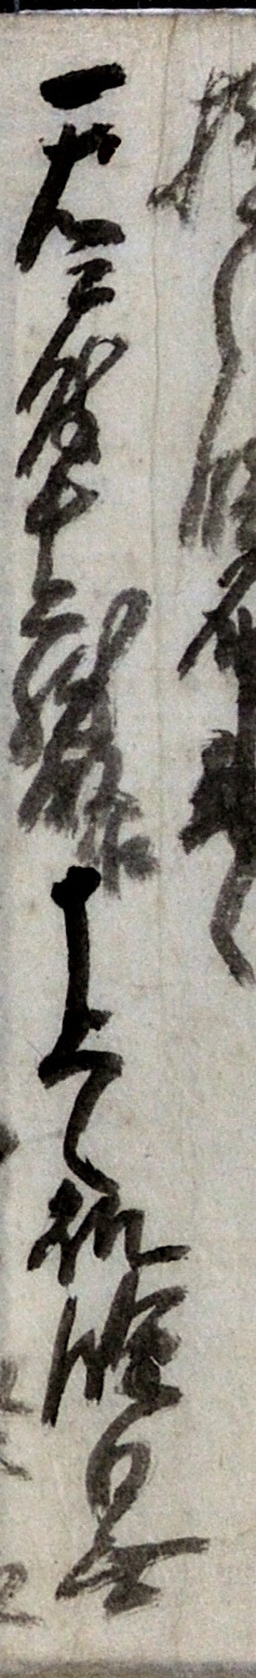一右に付十蔵殿江申上候様日無
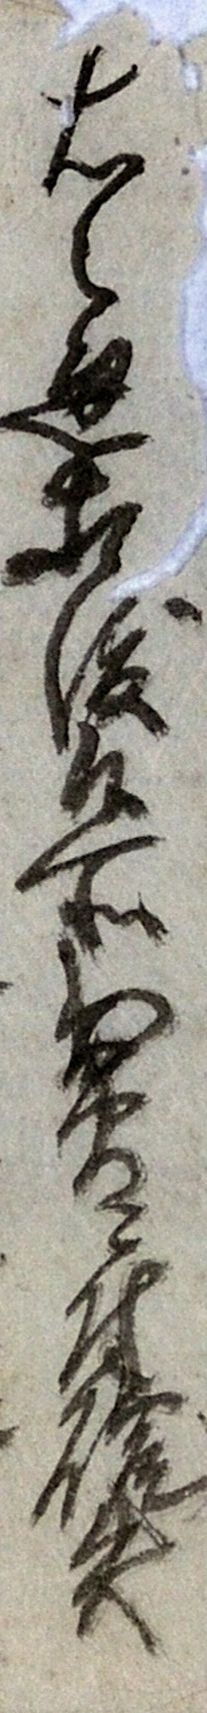右之通相渡候所出火に付焼失
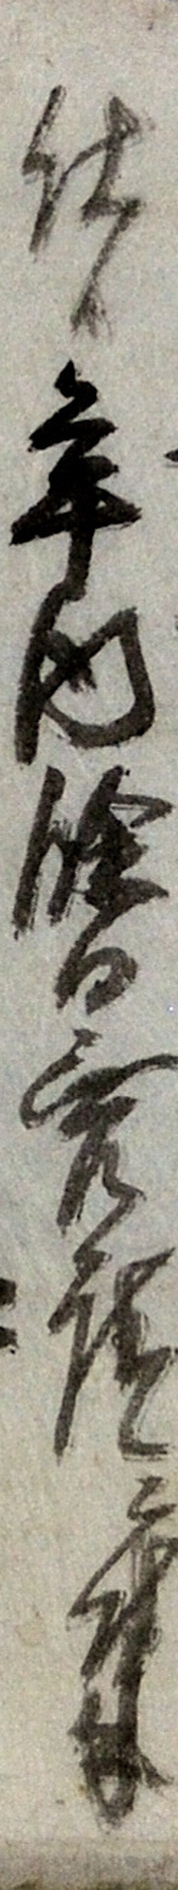仕候年内日無御座候二付来
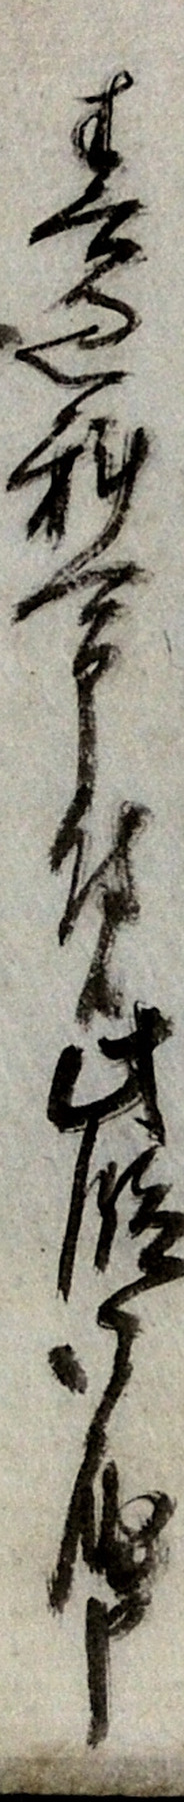春過料可申付候此段御届申
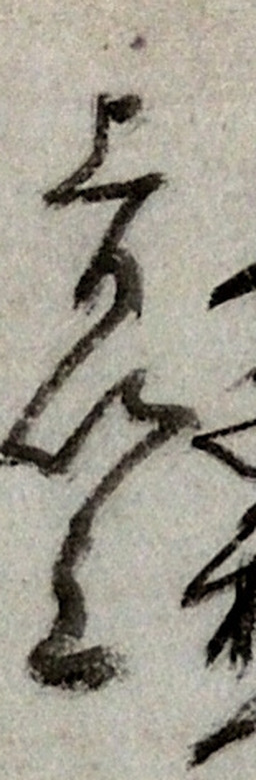上候以上
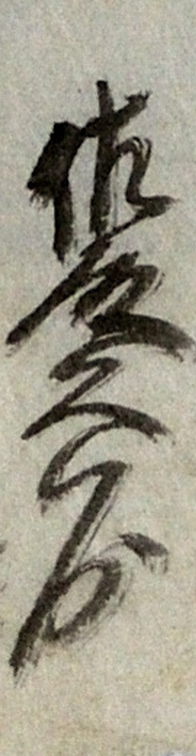佐藤久右衛門
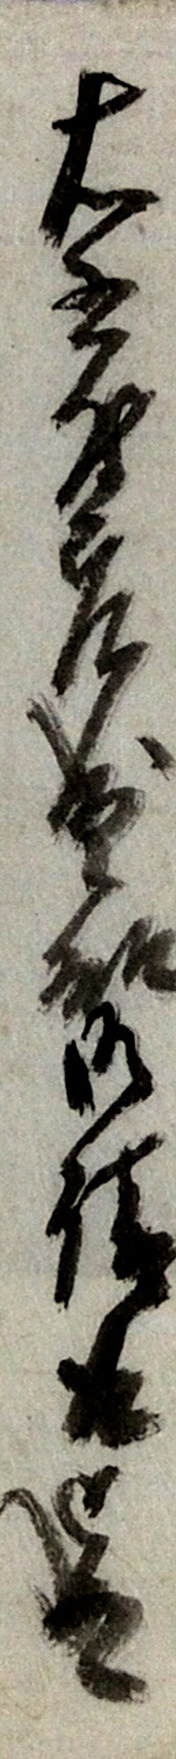右書付差出候段御請取候以上
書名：分一方諸事御用留帳
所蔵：伊那市立高遠町図書館・合同会社AMANE
